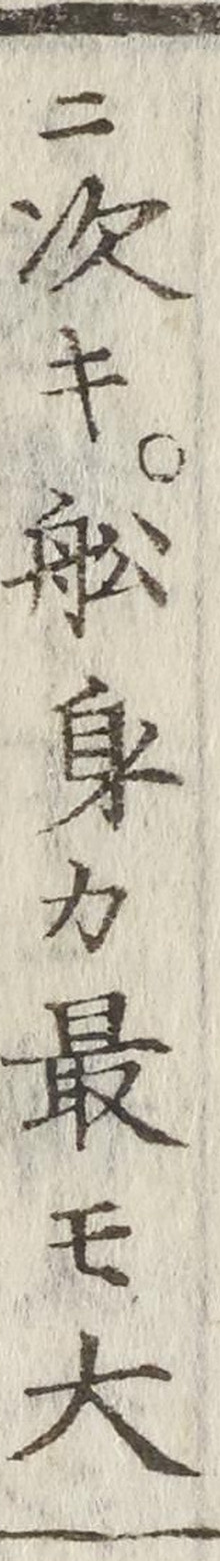ニ次キ。舩身カ最モ大
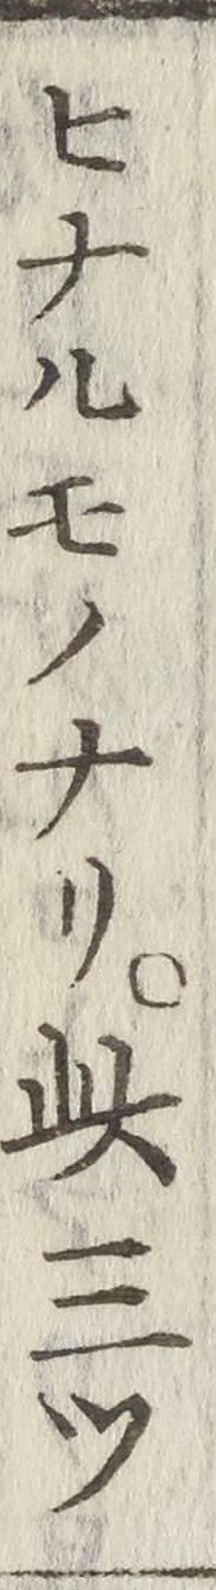ヒナルモノナリ。此三ツ
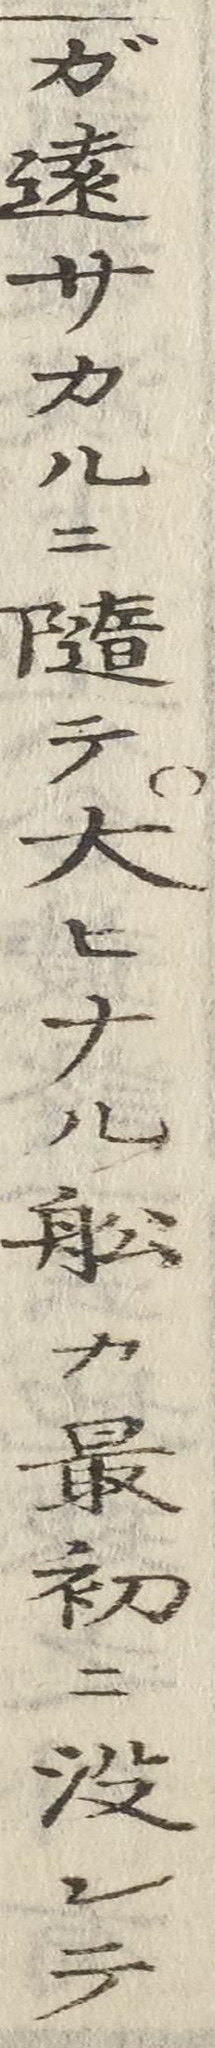ガ遠サカルニ随テ。大ヒナル舩ハ最初ニ没シテ
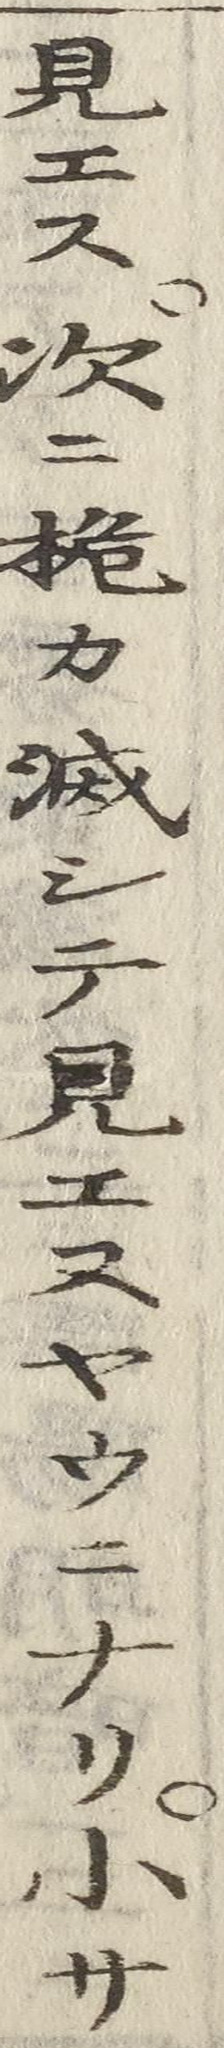見エス。次ニ桅カ滅シテ見エヌヤウニナリ。小サ
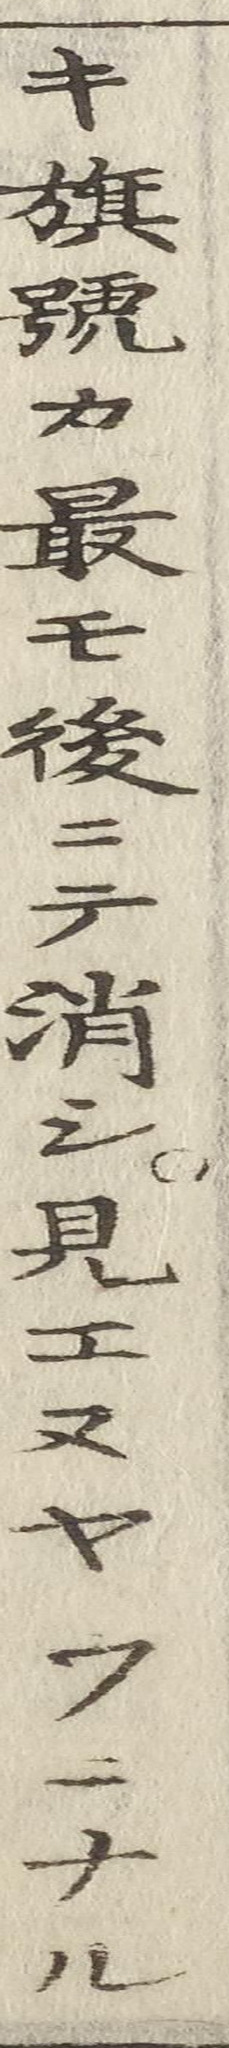キ旗号カ最モ後ニテ消シ。見エヌヤウニナル
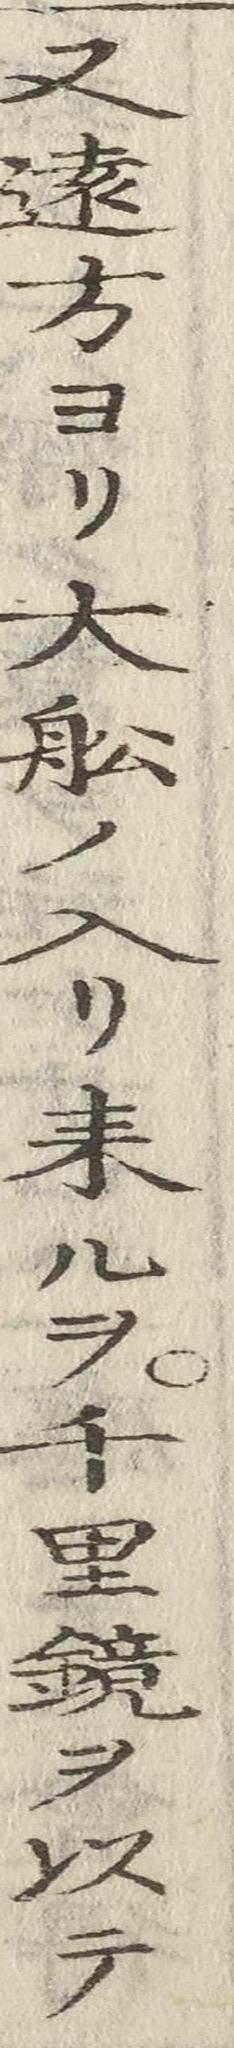又遠方ヨリ大舩ノ入リ来ルヲ。千里鏡ヲ以テ
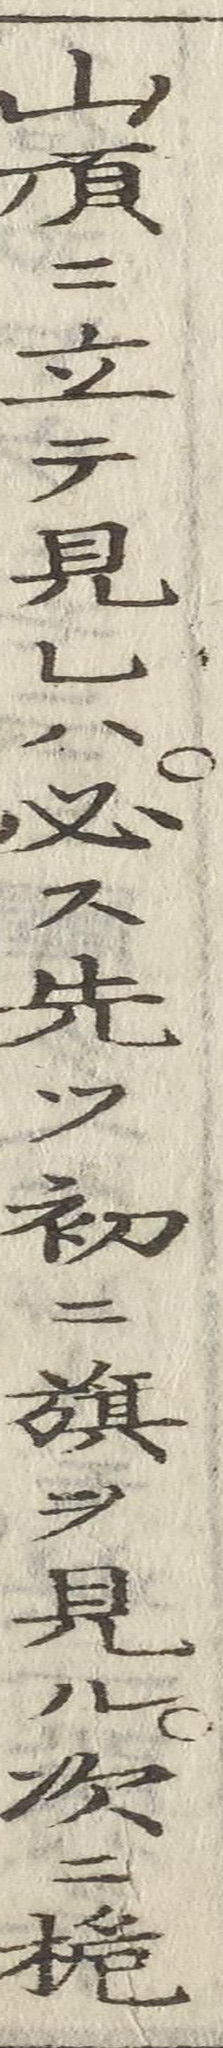山頂ニ立テ見レハ。必ス先ツ初ニ旗ヲ見ル。次ニ桅
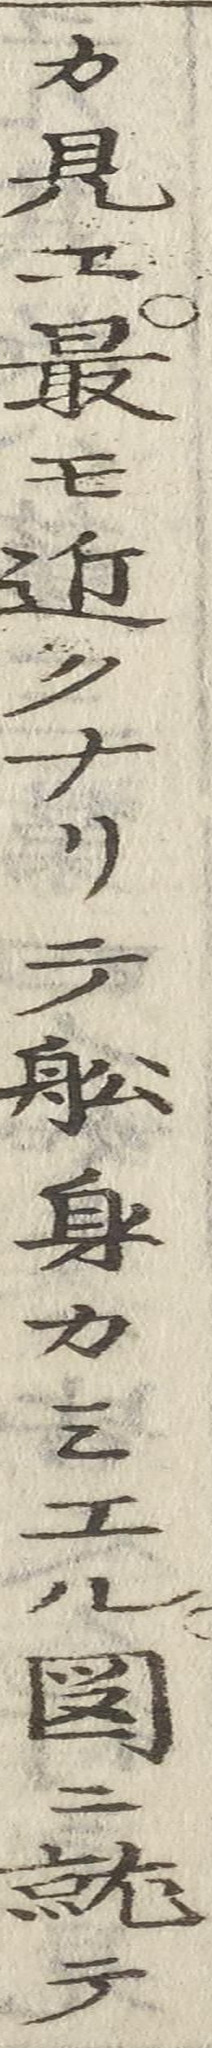カ見エ。最モ近クナリテ舩身カミエル。図ニ就テ
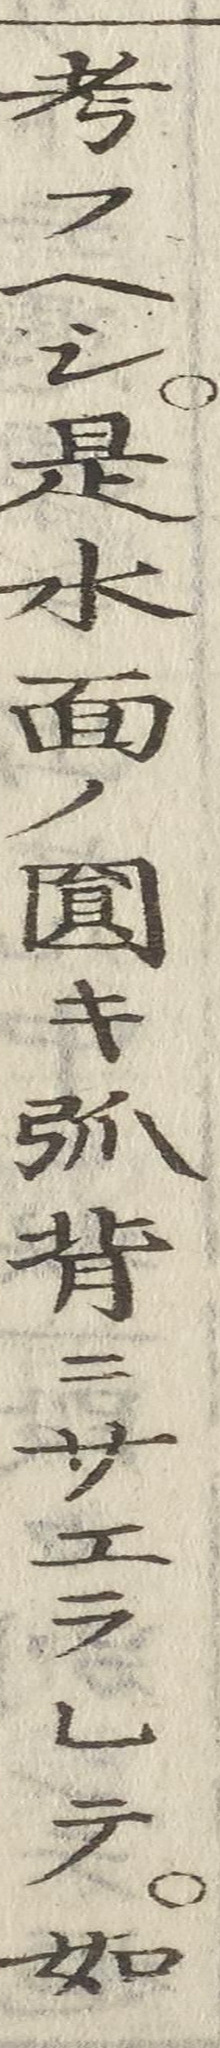考フヘシ。是水面ノ円キ弧背ニサエラレテ。如
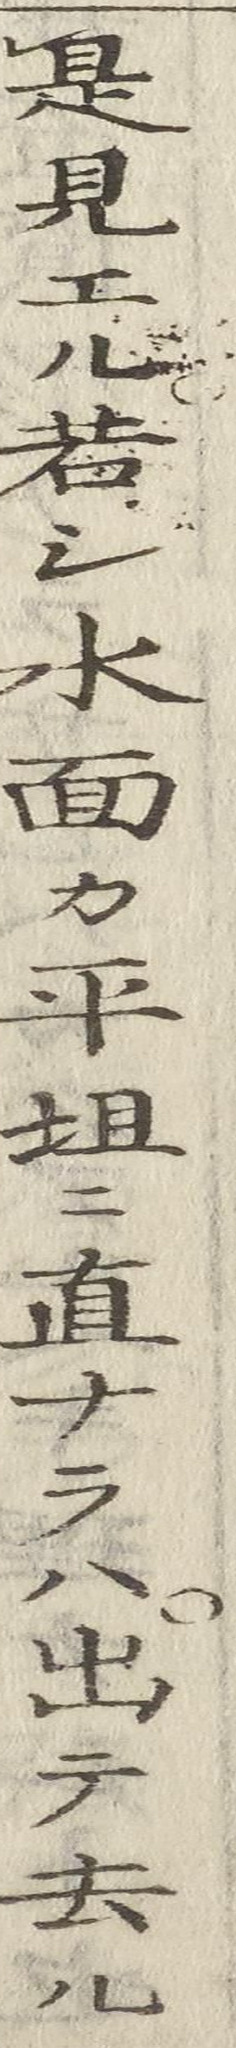是見エル若シ水面カ平坦ニ直ナラハ。出テ去ル
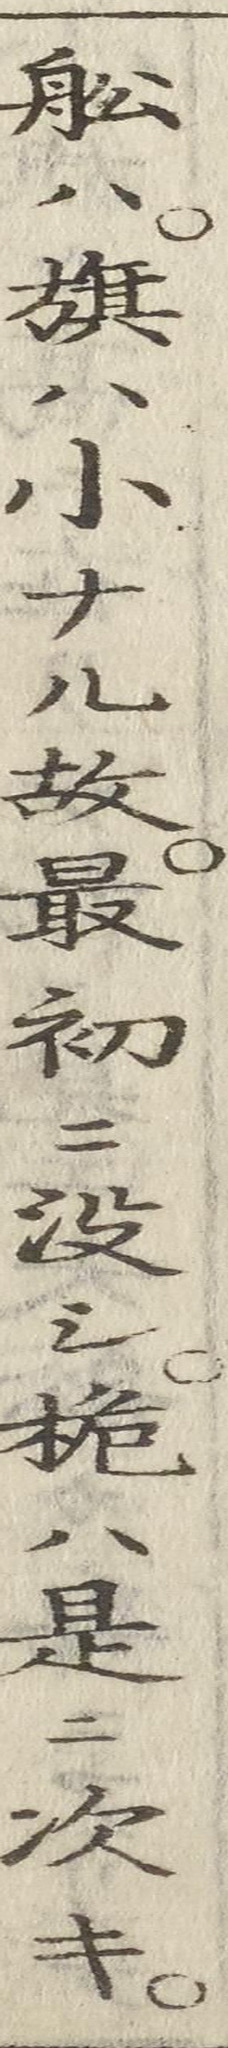舩ハ。旗ハ小ナル故。最初ニ没シ。桅ハ是ニ次キ。
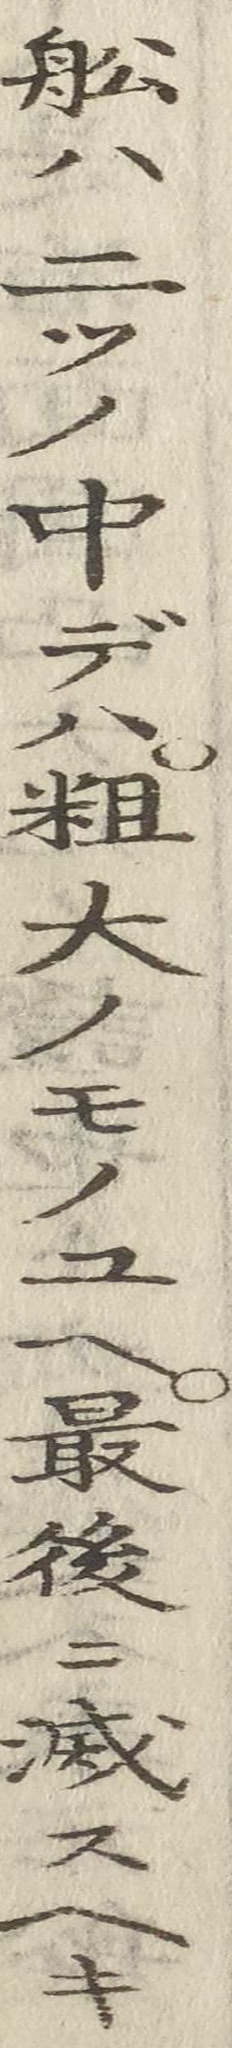舩ハ二ツノ中デハ。粗大ノモノユヘ。最後ニ滅スヘキ

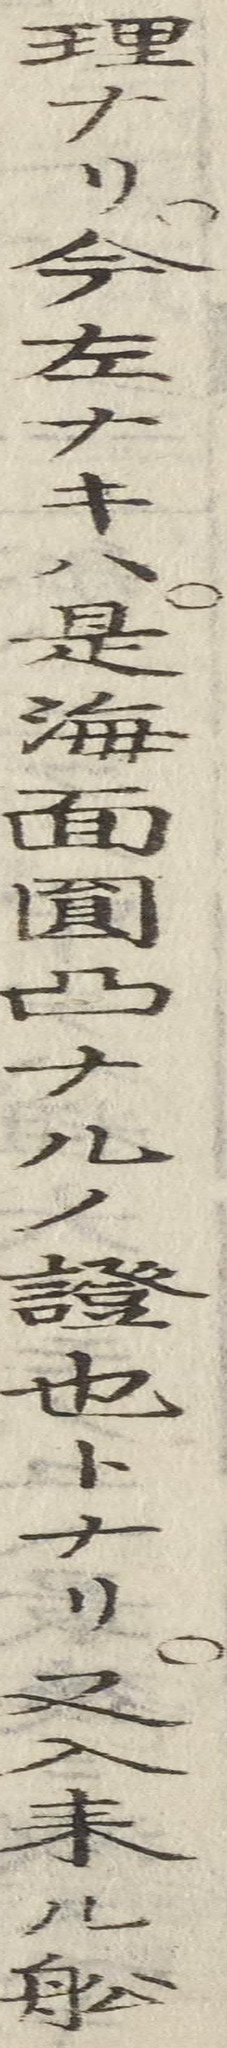理ナリ。今左ナキハ。是海面円凸ナルノ証也トナリ。又入来ル舩
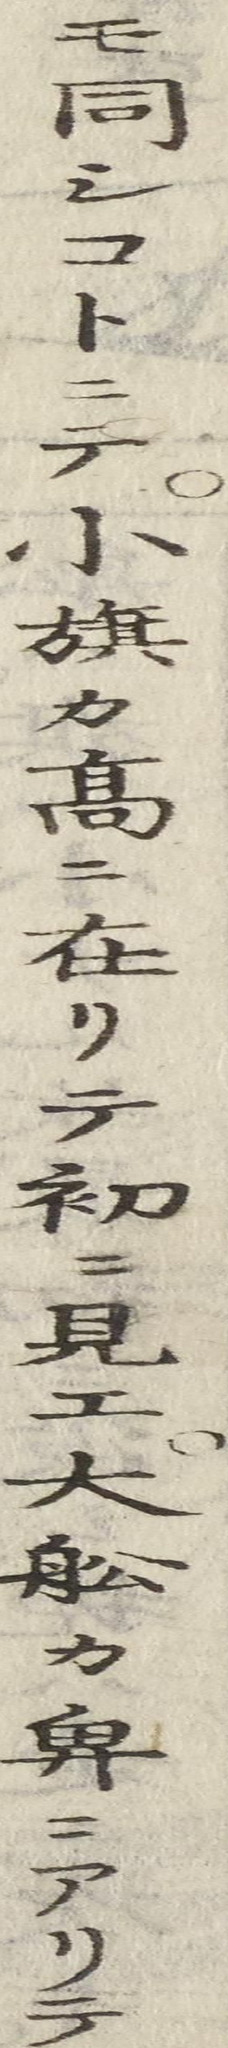モ同シコトニテ。小旗カ高ニ在リテ初ニ見エ。大舩カ卑ニアリテ
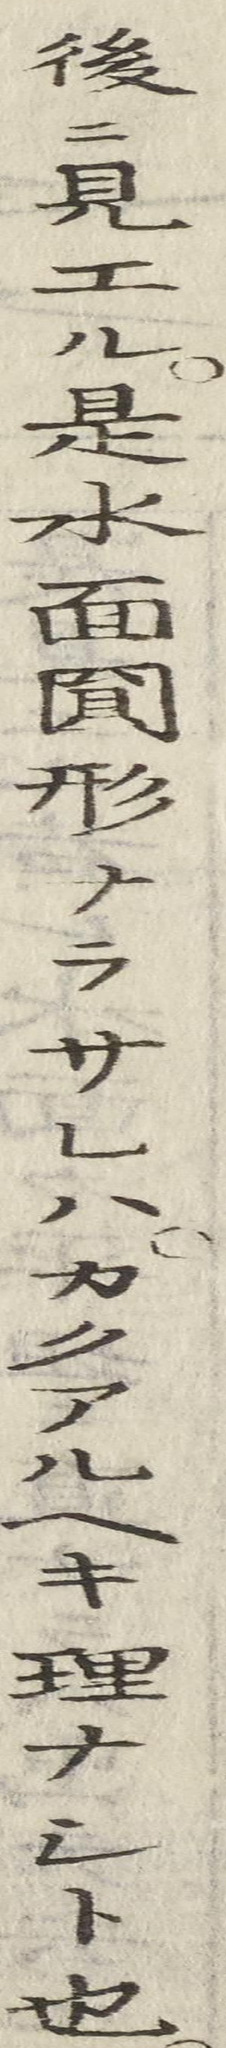後ニ見エル。是水面円形ナラサレハカクアルヘキ理ナシト也。
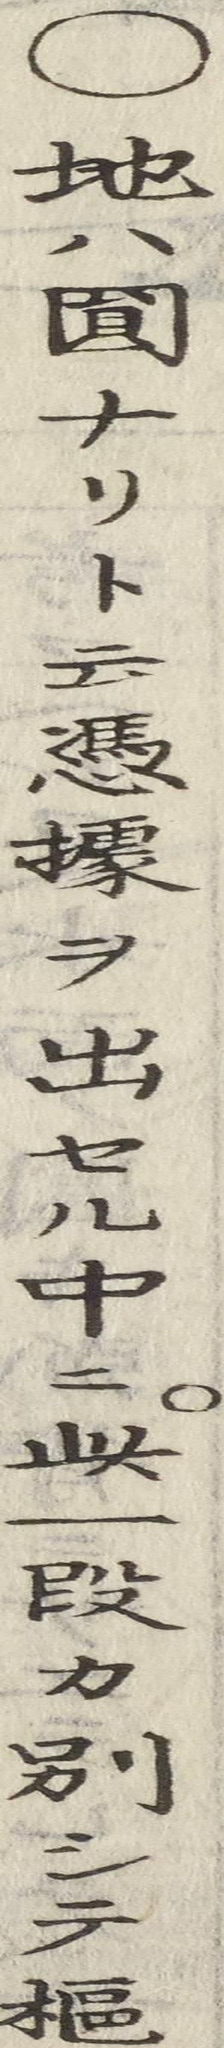○地ハ円ナリトテ憑拠ヲ出セル中ニ。此一段カ別シテ枢
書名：護法新論　中
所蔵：東京大学地震研究所図書室 Earthquake Research Institute Library, The University of Tokyo, JAPAN
